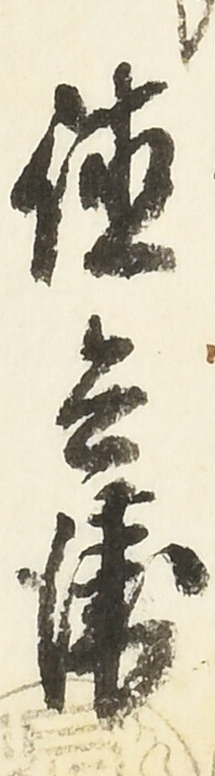傳兵衛
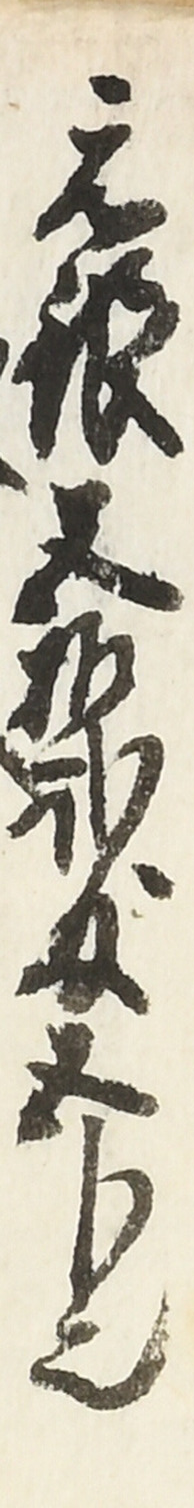元銀五拾弐匁五分也
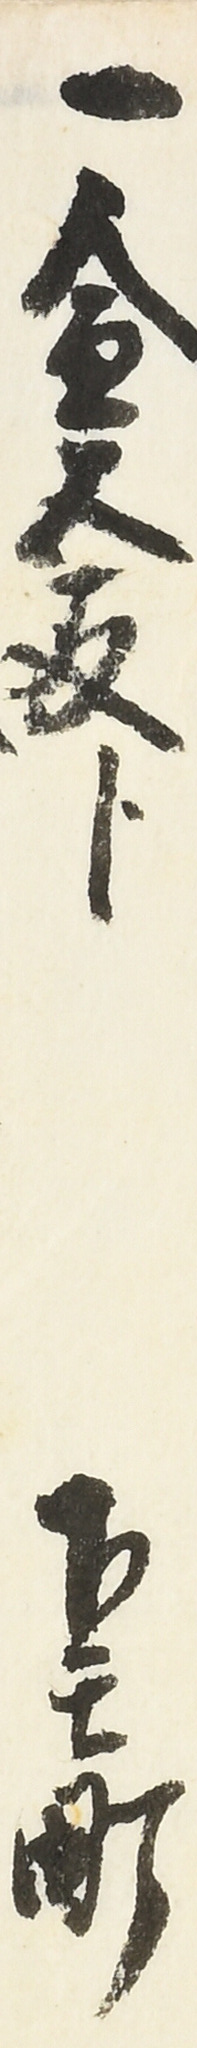一金五両ト下モ町
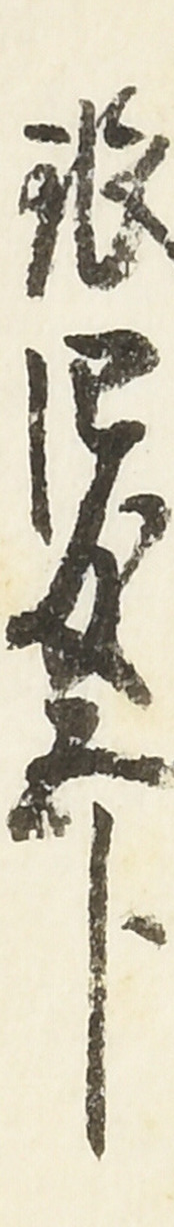銀四匁五分
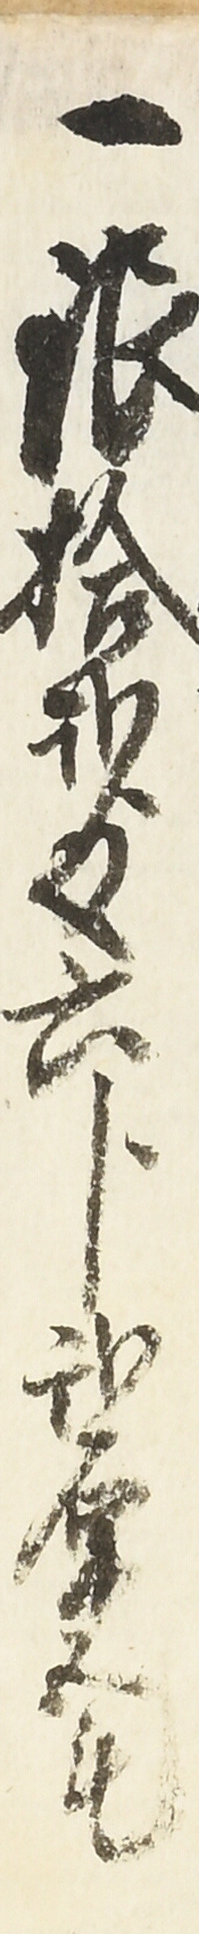一銀拾弐匁六分弐厘五毛

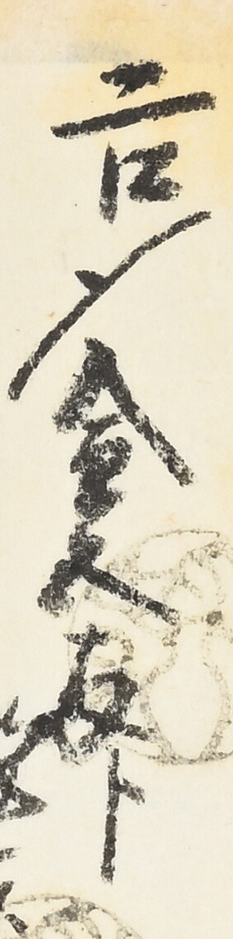二口〆金五両ト
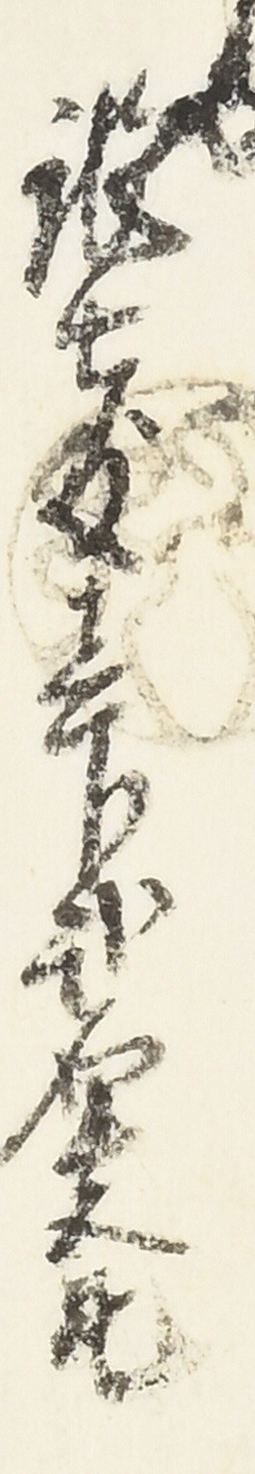銀七匁壱分弐厘五毛
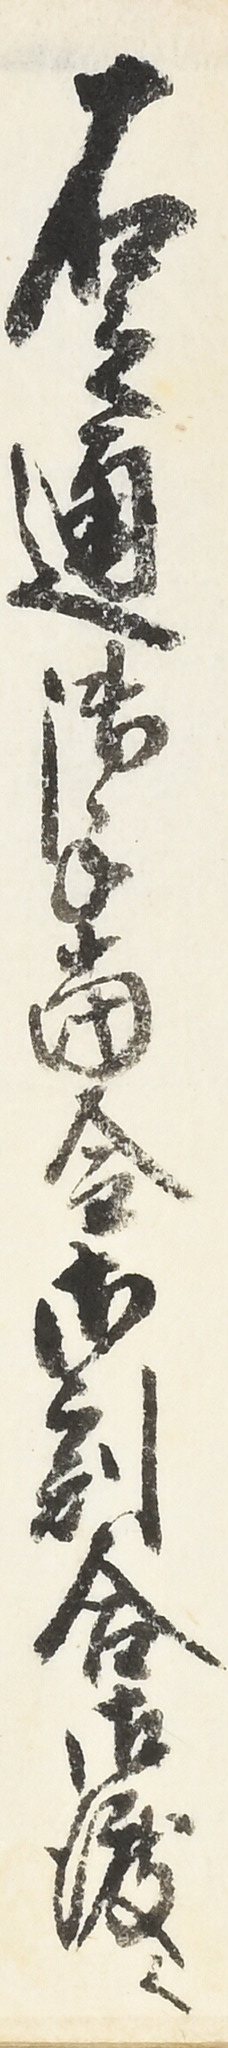右之通御手当金御割合御渡し
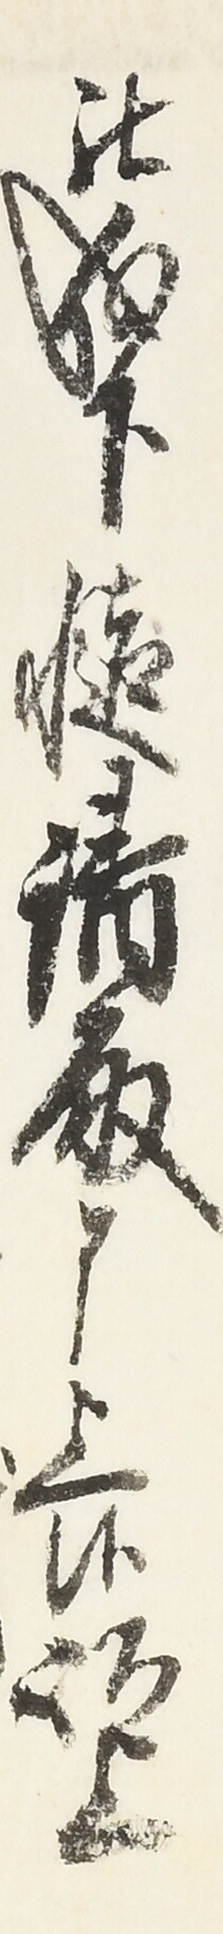被成下慥請取申上候以上
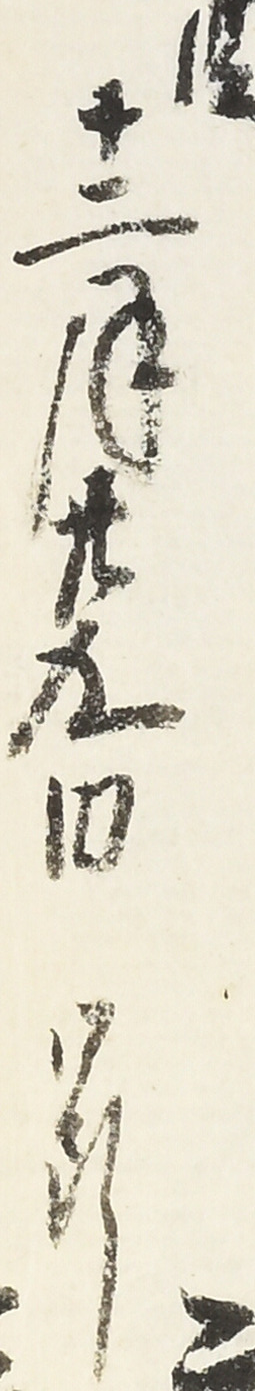十二月廿九日同断
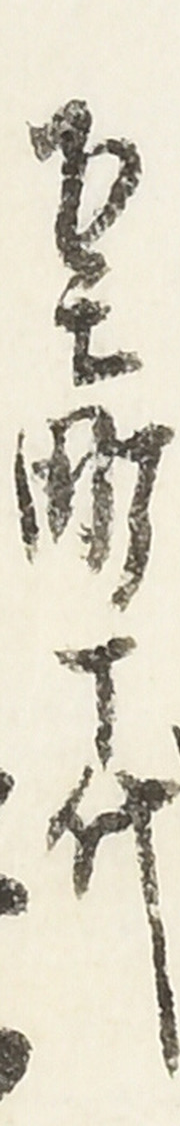下モ町丁代
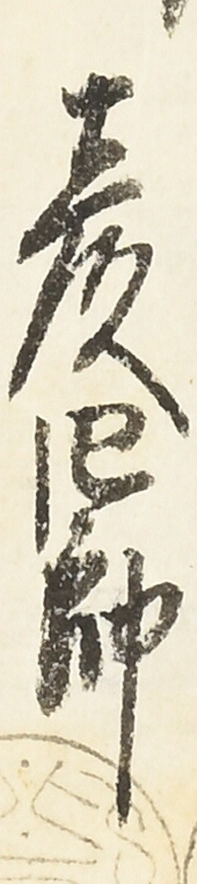彦四郎
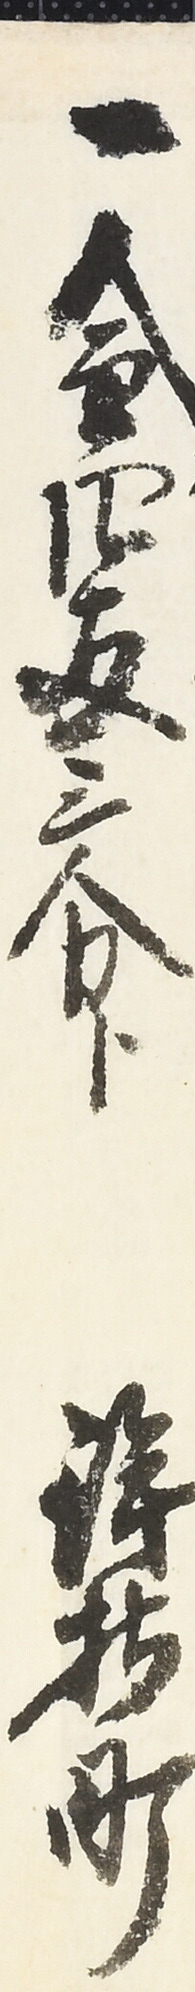一金四両三分ト鉾持町
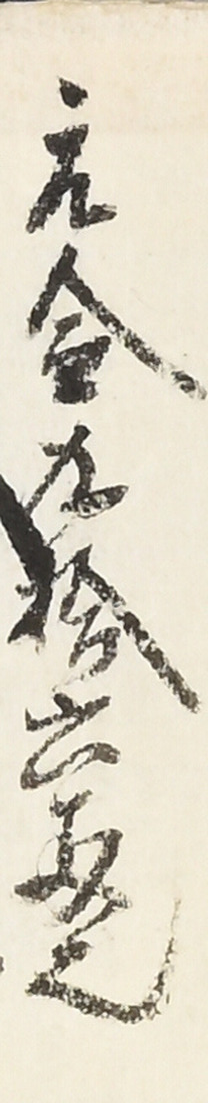元金九拾六両也
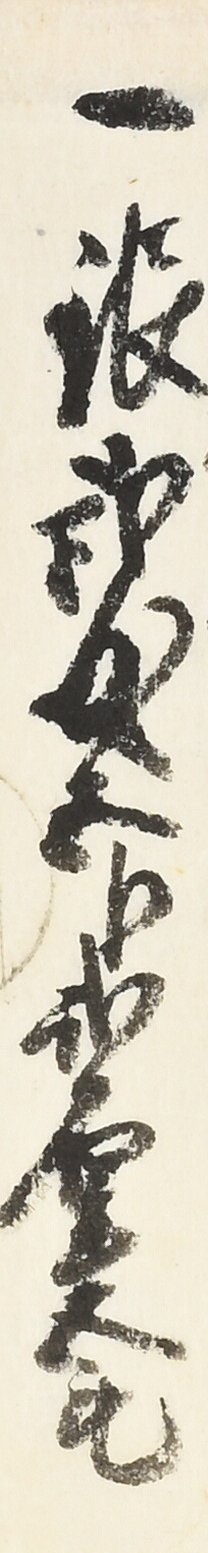一銀弐匁五分弐厘五毛
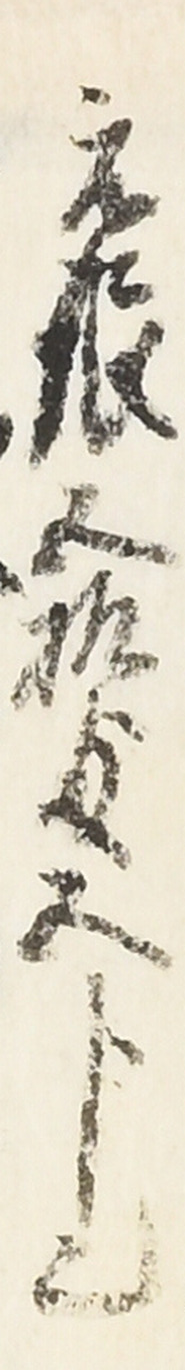元銀五拾匁五分也
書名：御才覚金御利足割渡扣帳
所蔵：伊那市立高遠町図書館・合同会社AMANE
